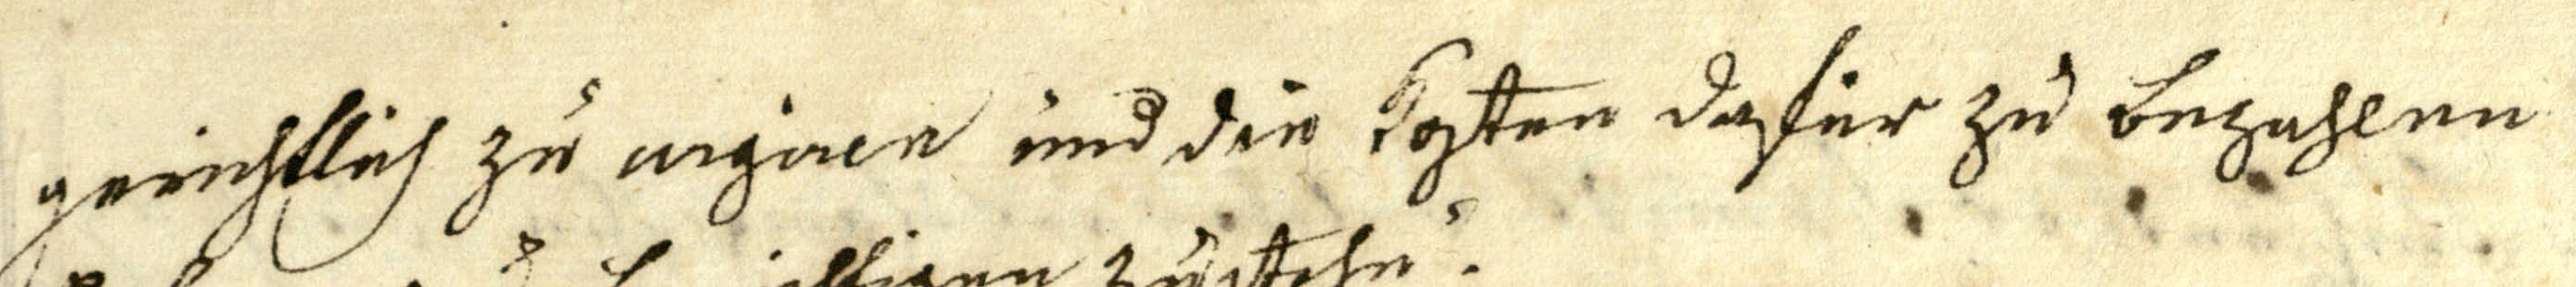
gerichtlich zu urgiren und die Kosten dafür zu bezahlen
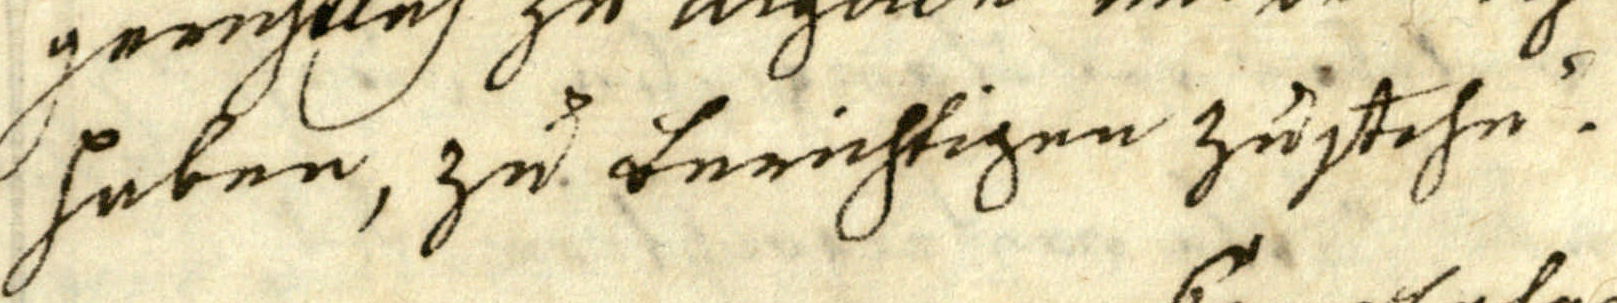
haben, zu berichtigen zustehe?
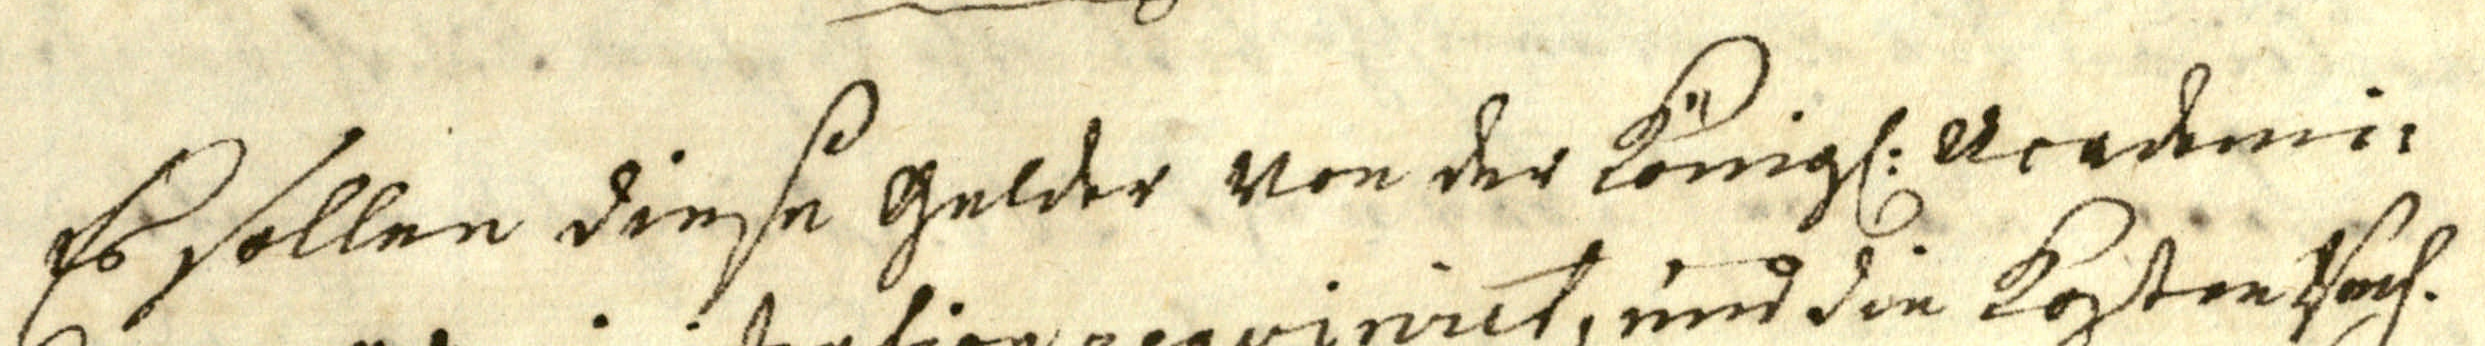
Es sollen diese Gelder von der Königl. Academi¬
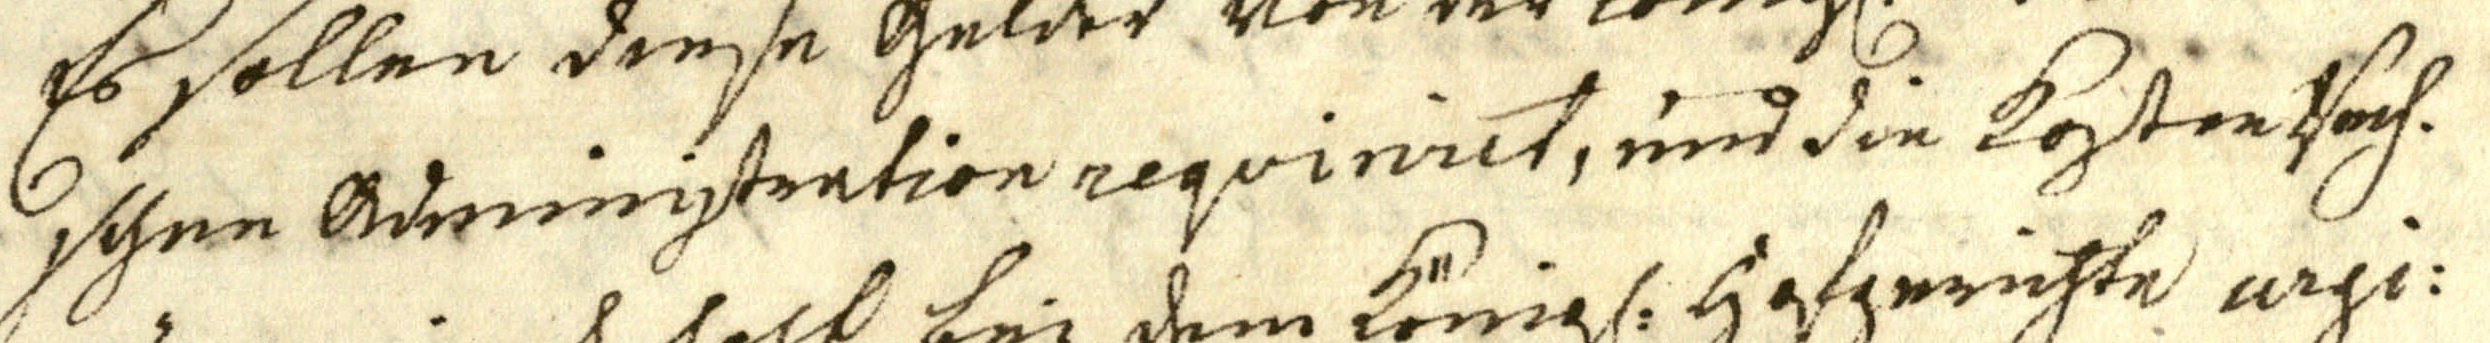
schen Administration requiriret, und die Kosten Rech¬
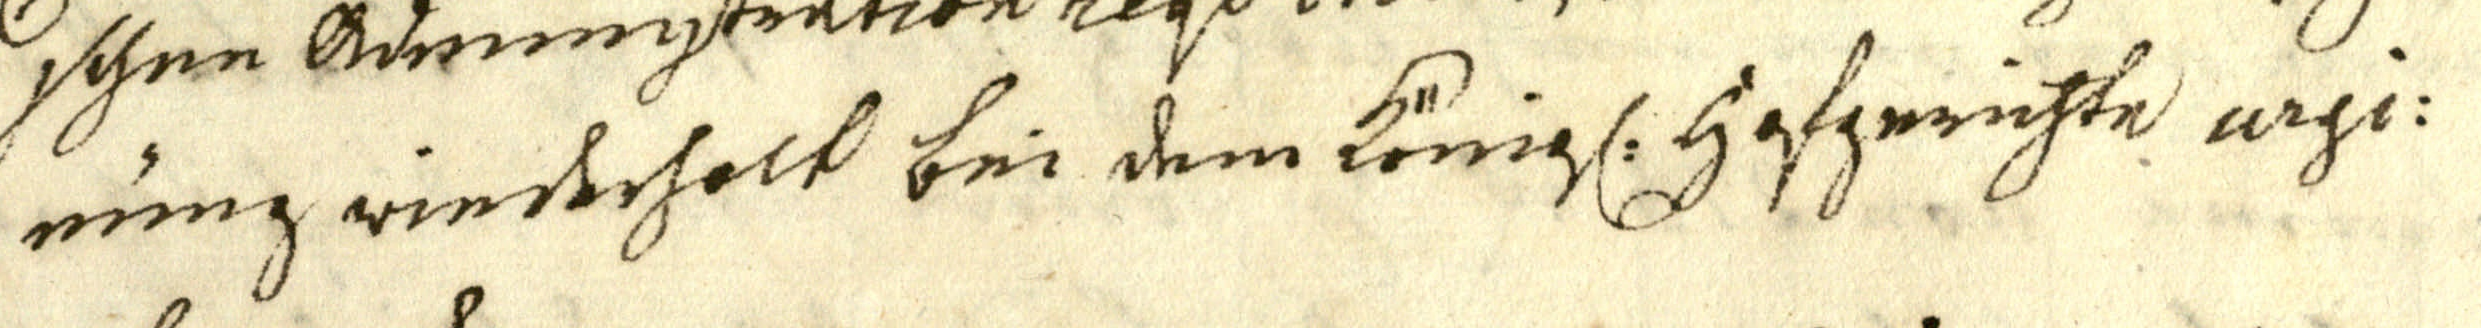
nung wiederholt bei dem Königl. Hofgerichte ur¬
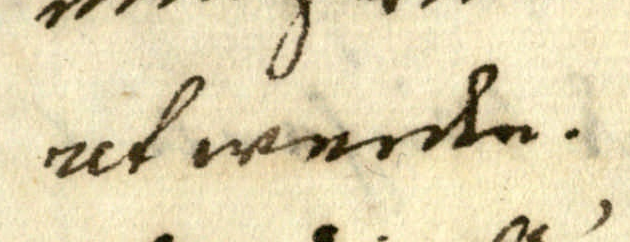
ret werden.
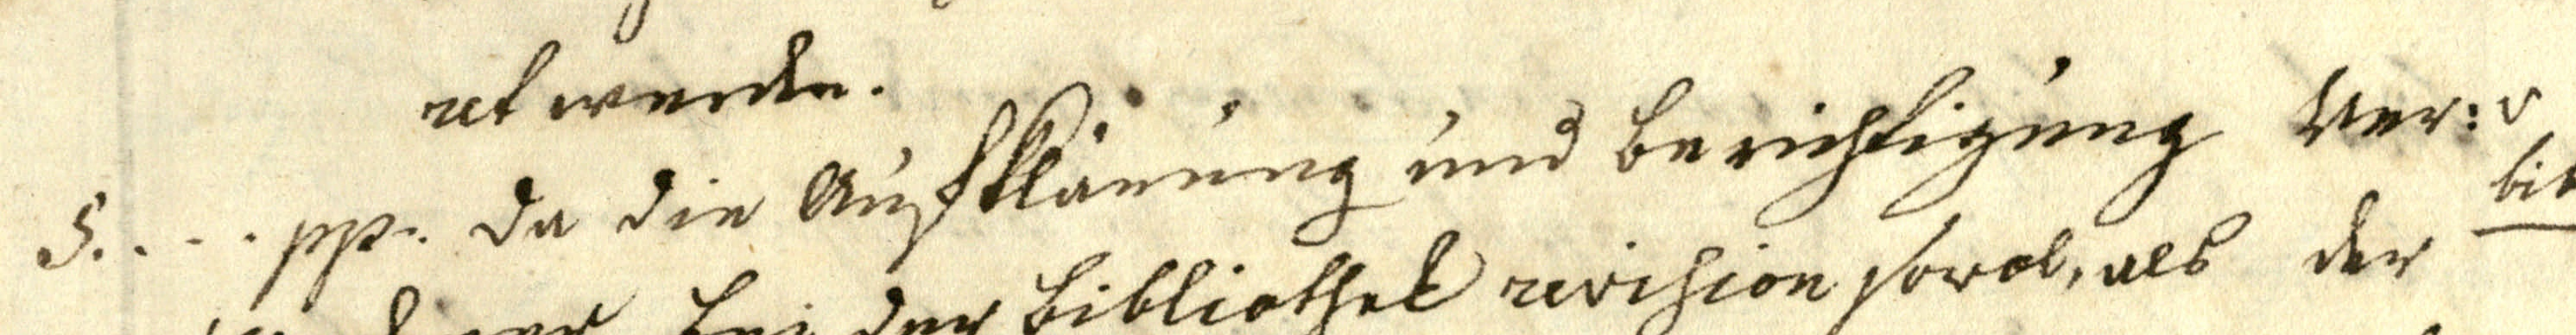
5. pp. Da die Aufklärung und Berichtigung ver¬
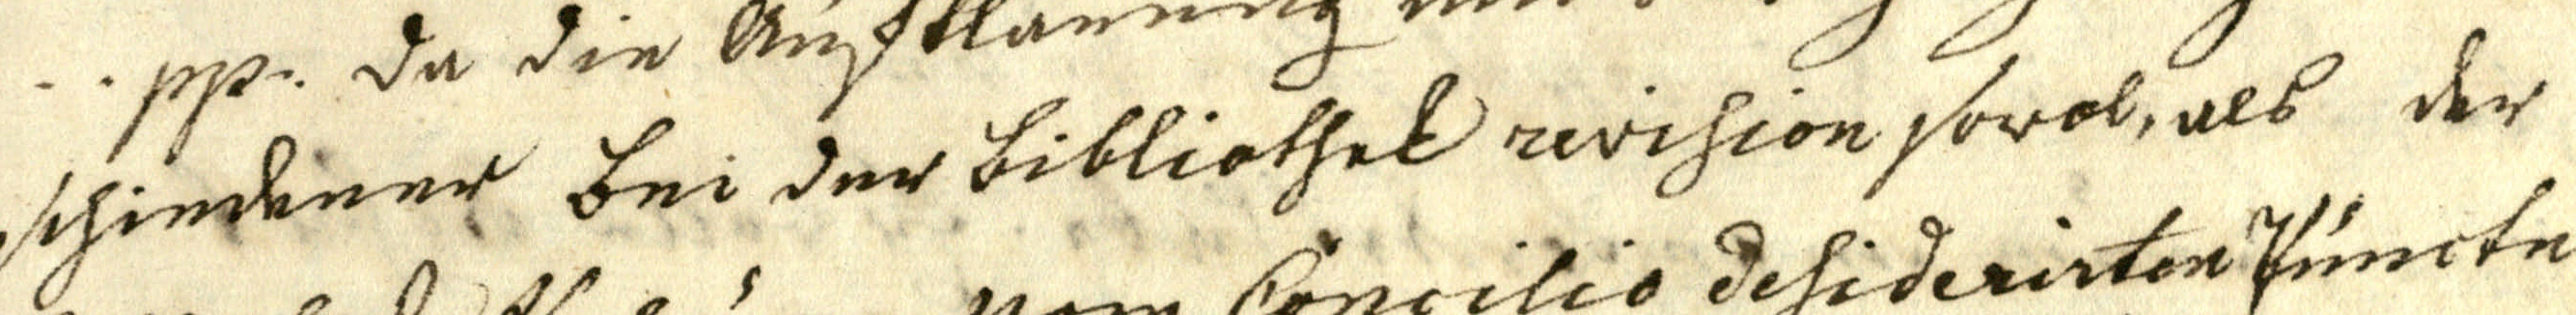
schiedener bei der Bibliothek revision sowol, als der
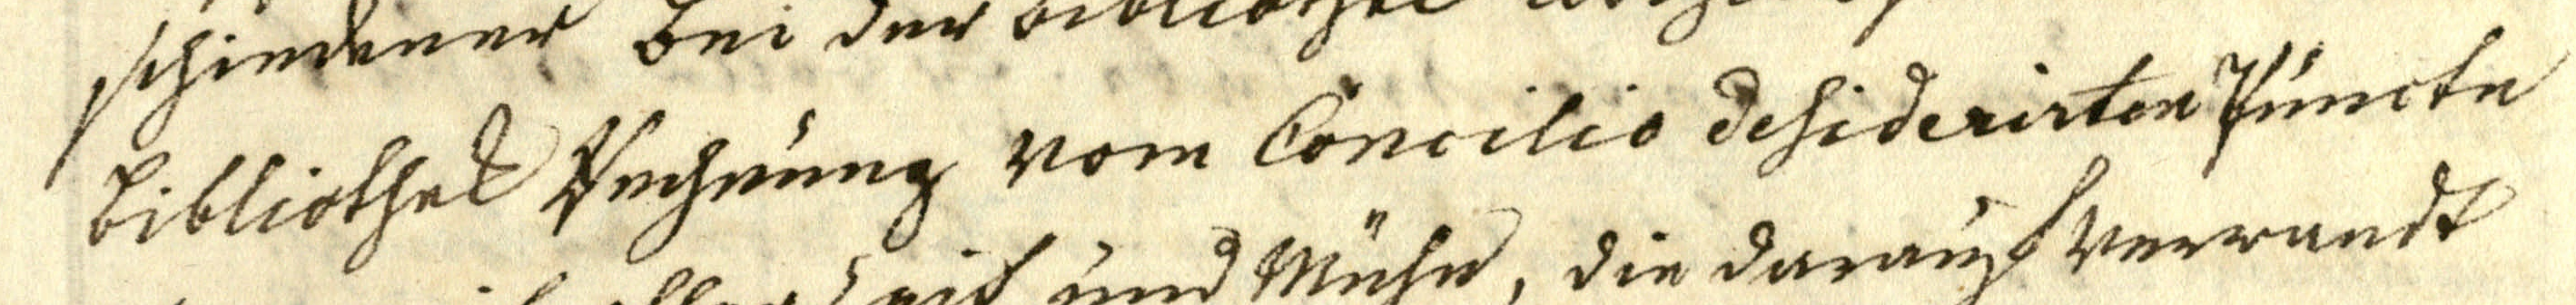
Bibliothek Rechnung vom Concilio desiderirten Puncte
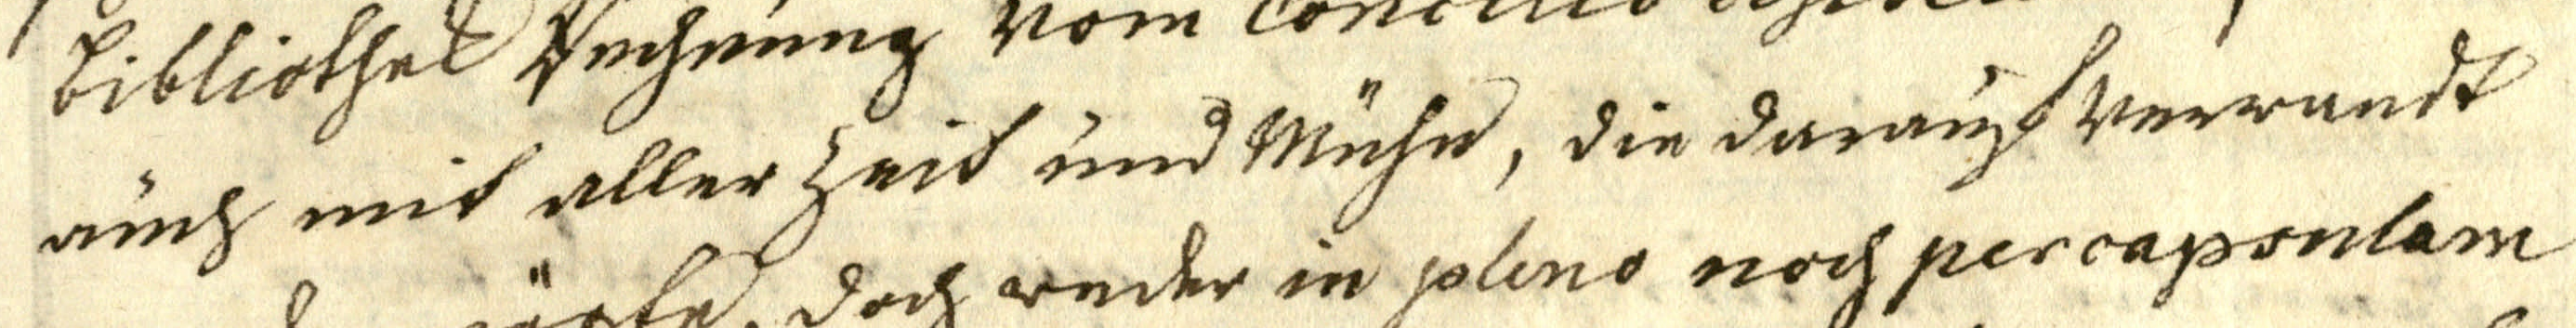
auch mit aller Zeit und Mühe, die darauf verwandt
